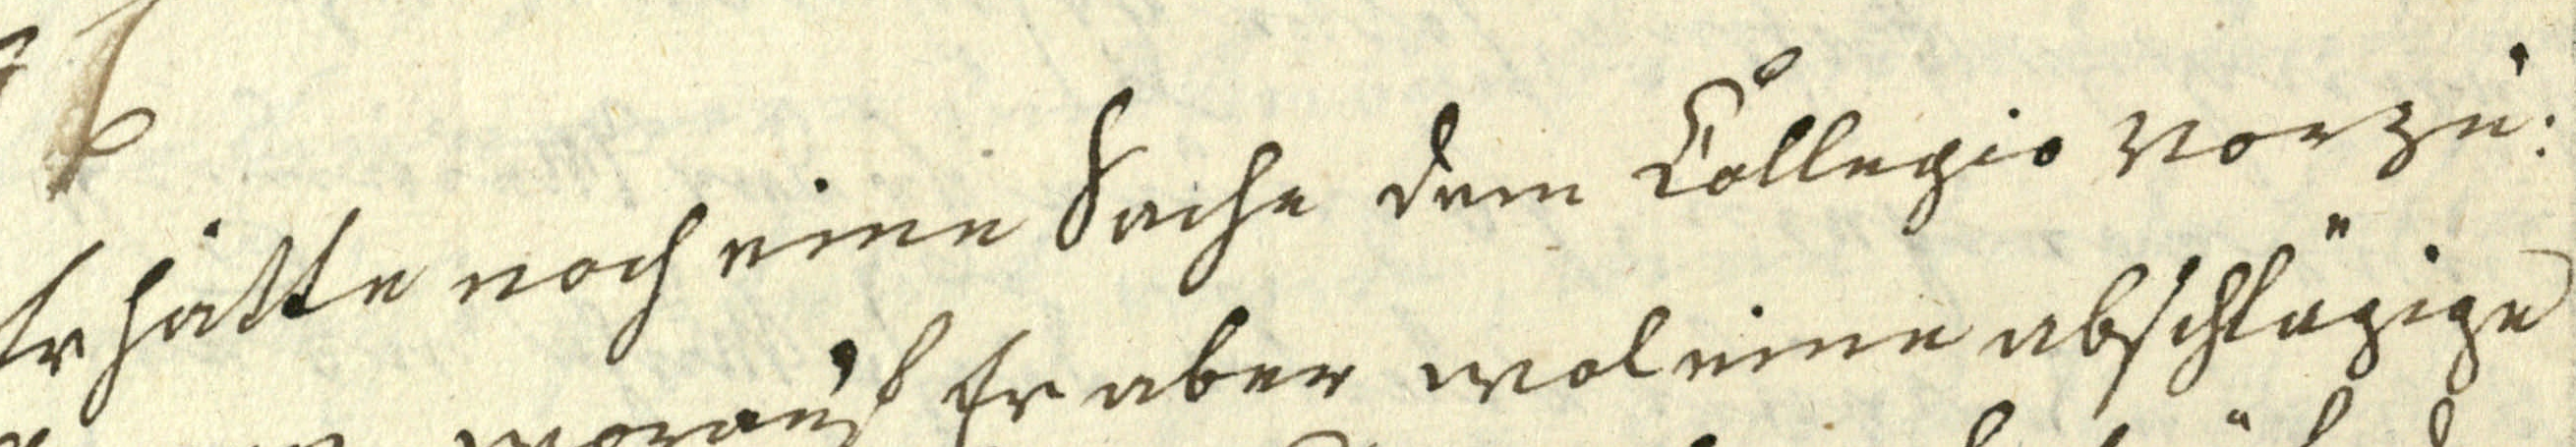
Er hätte noch eine Sache dem Collegio vorzu¬
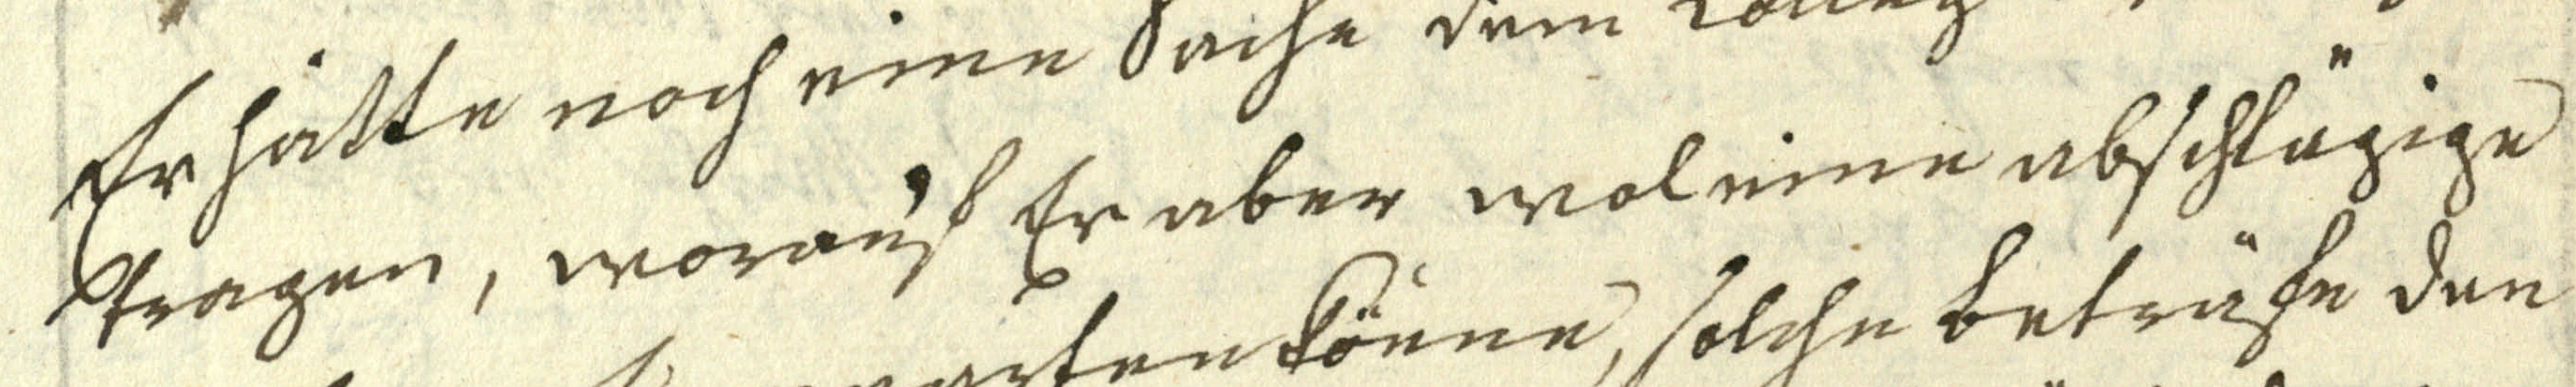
tragen, worauf Er aber wol eine abschlägige
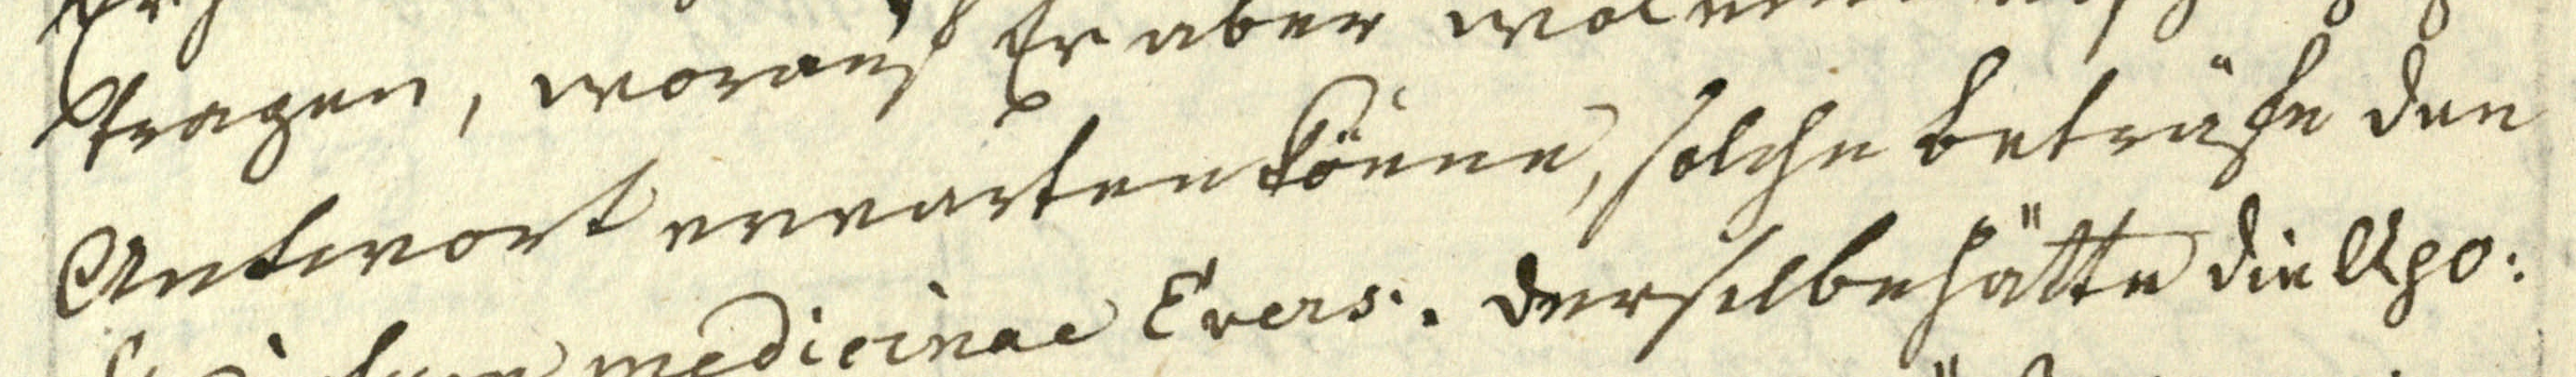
Antwort erwarten könne, solche beträfe den
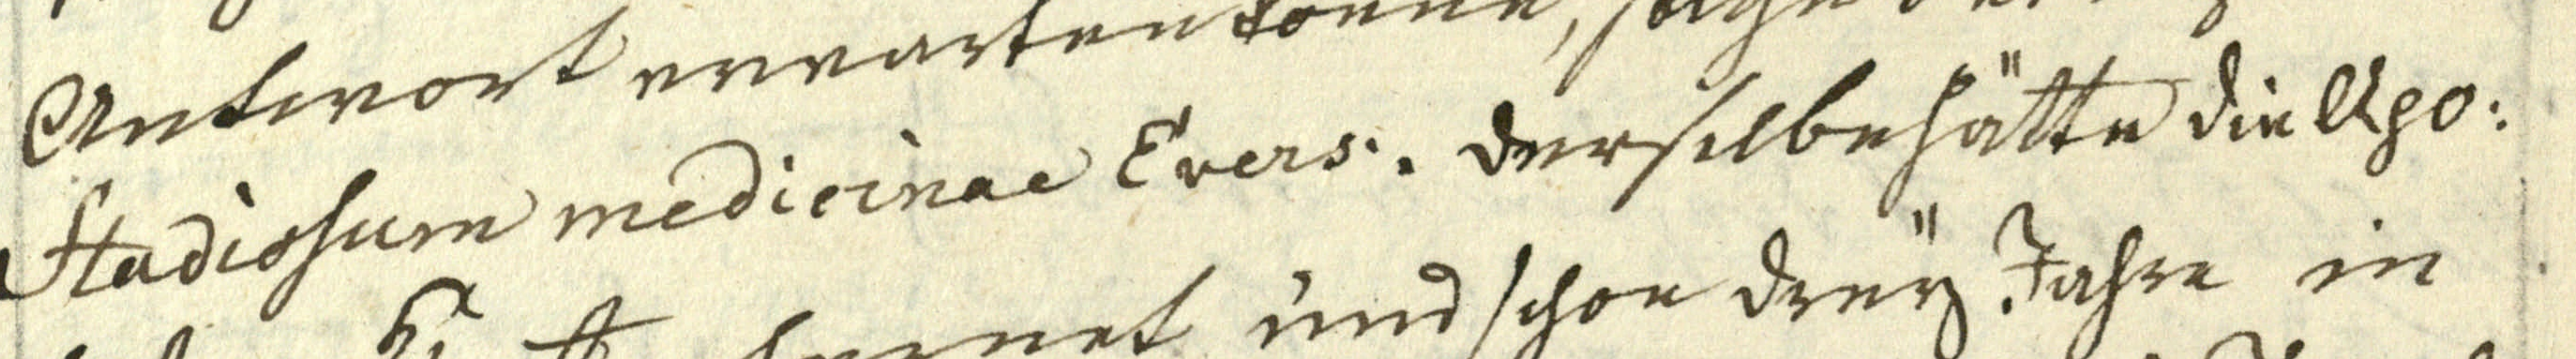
Studiosum medicinae Evers. Derselbe hätte die Apo¬
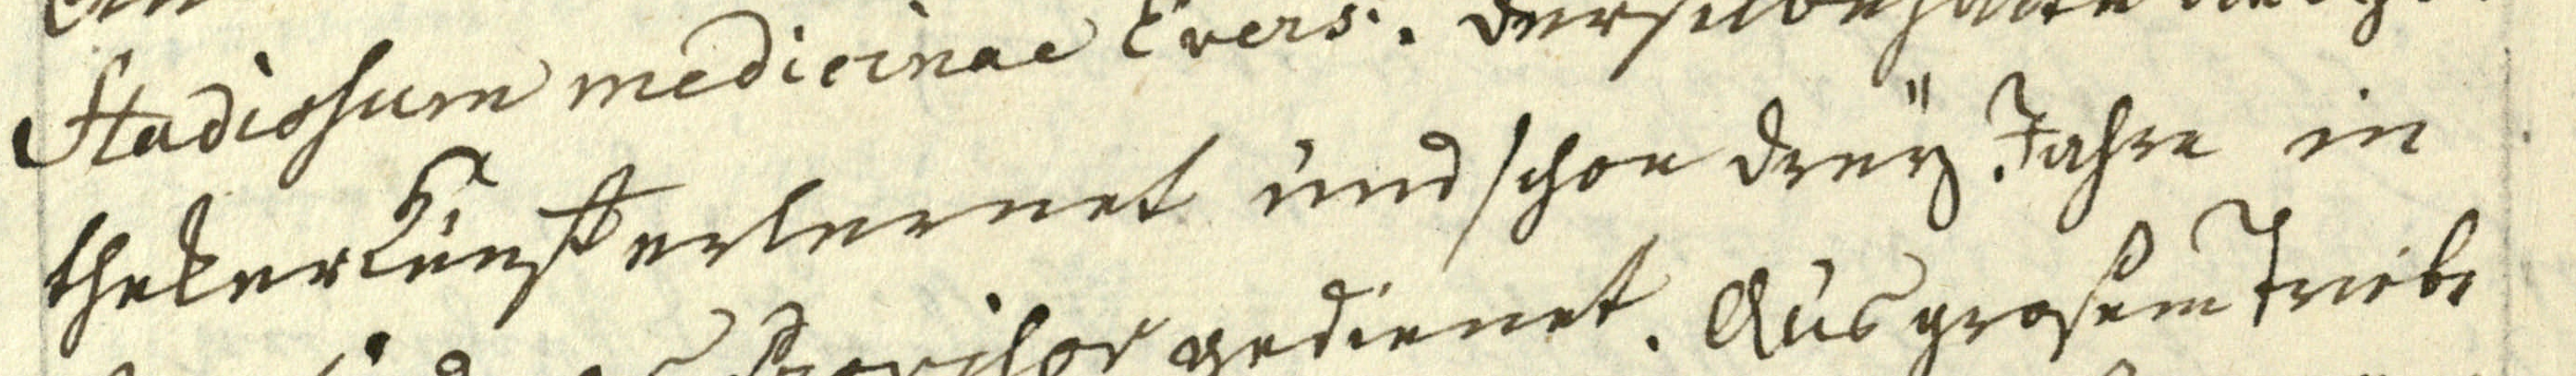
thekerKunst erlernet und schon dreÿ Jahre in
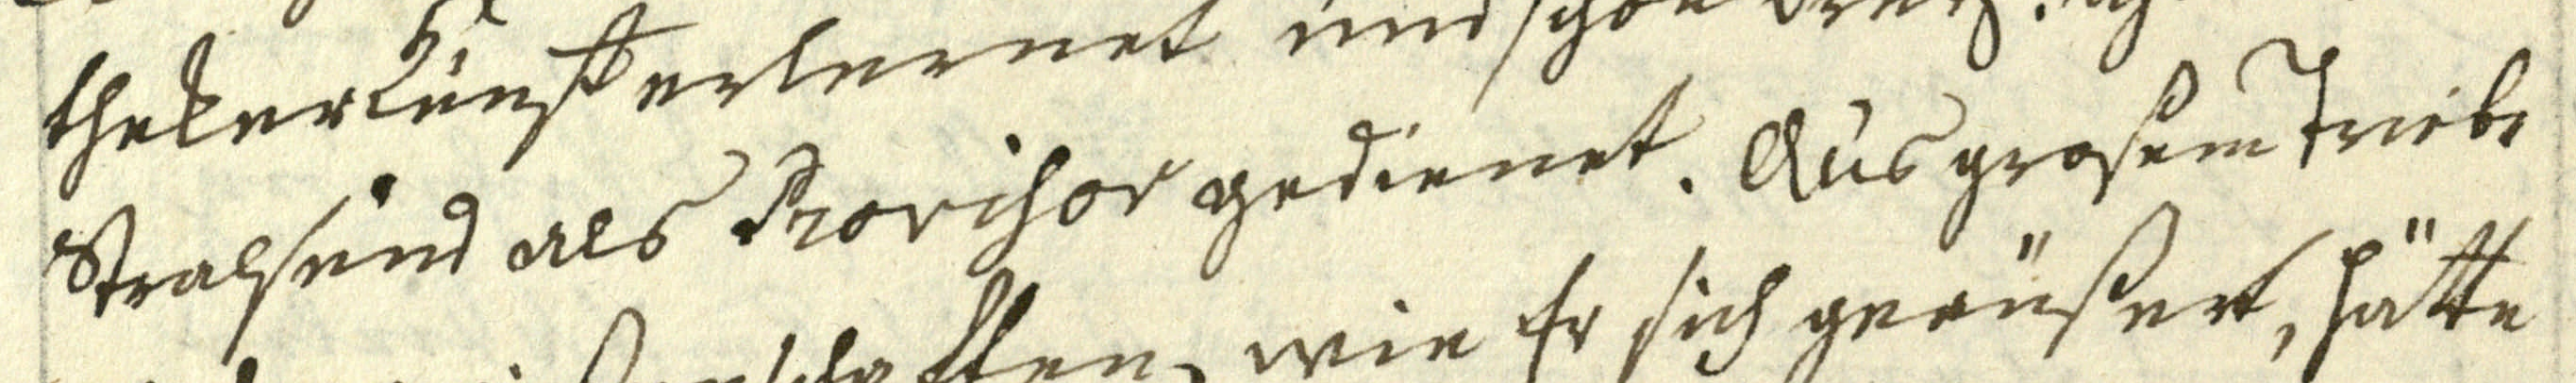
Stralsund als Provisor gedienet. Aus großem Triebe
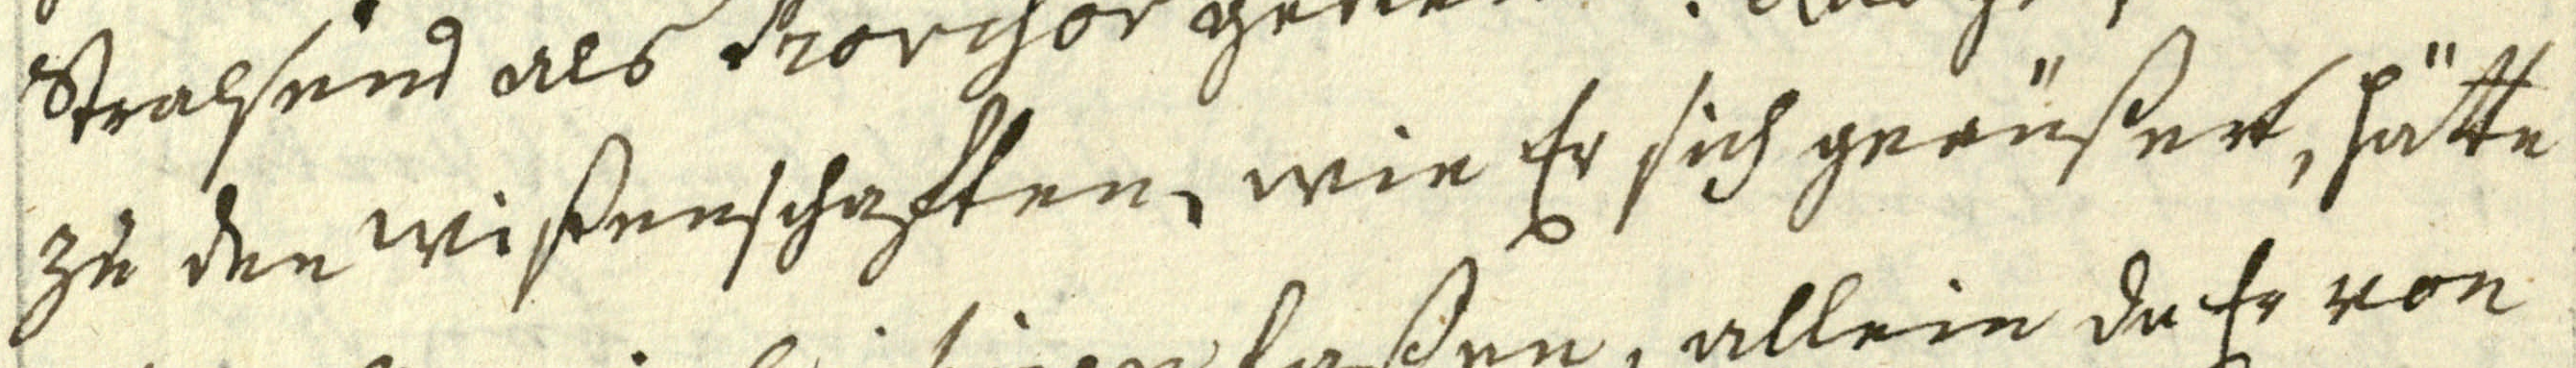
zu den Wissenschaften, wie Er sich geäußert, hätte
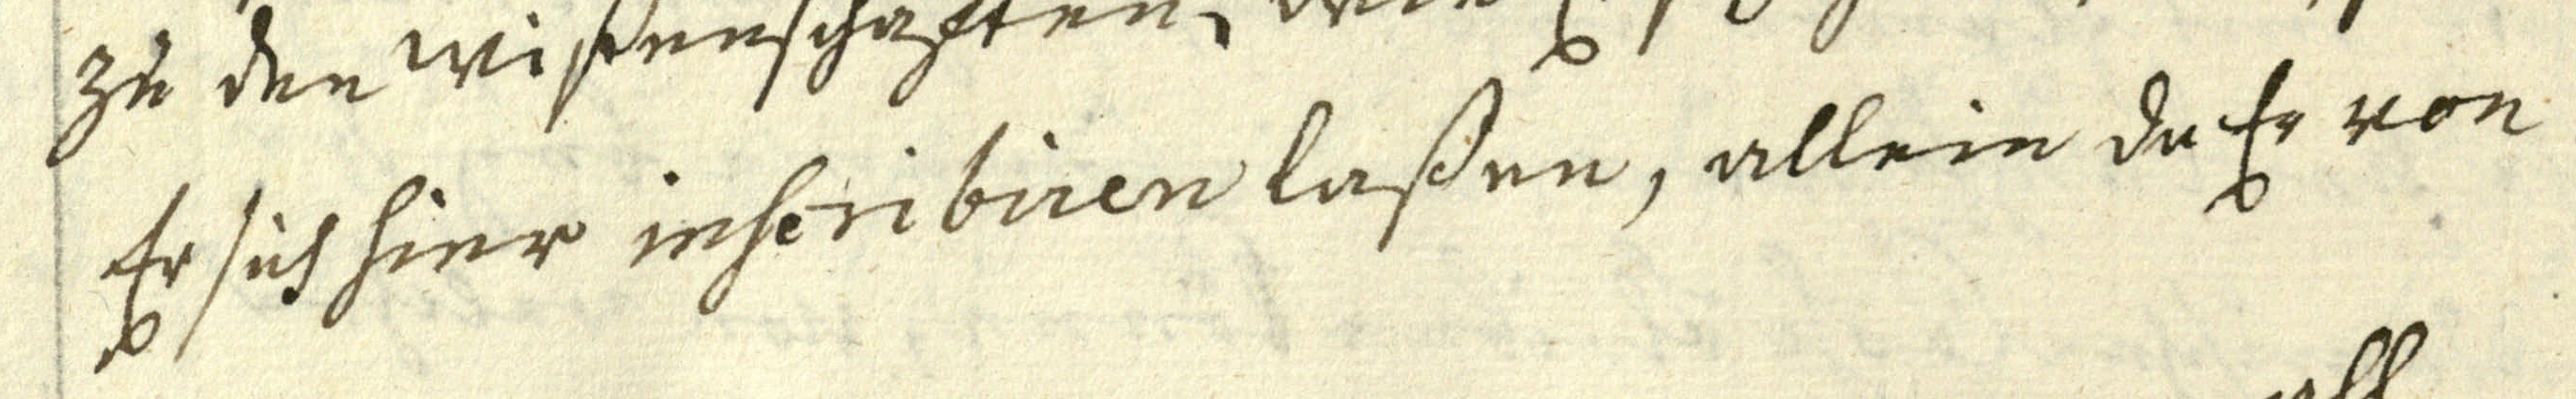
Er sich hier inscribiren laßen, allein da Er von
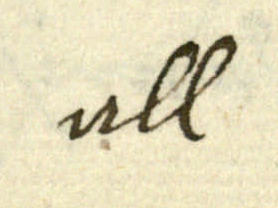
all
